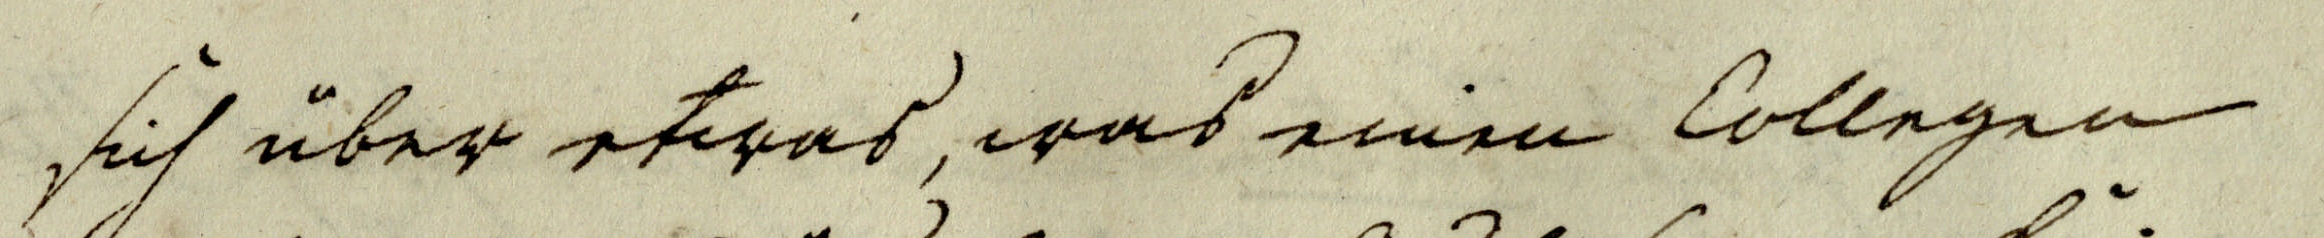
sich über etwas, was einen Collegen
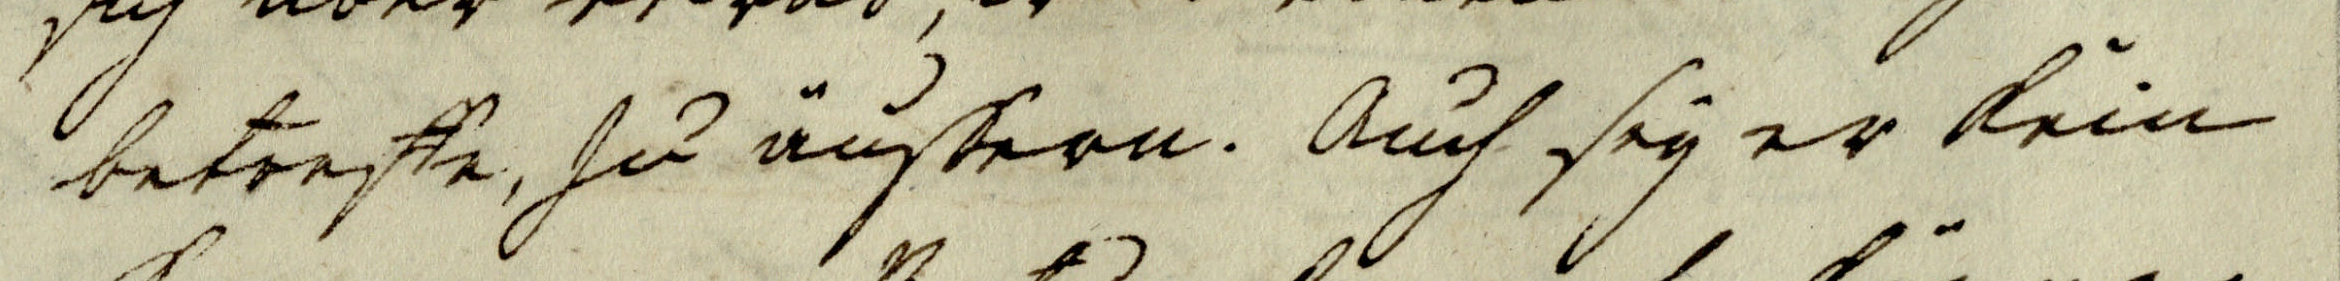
betreffe, zu äussern. Auch seÿ er kein
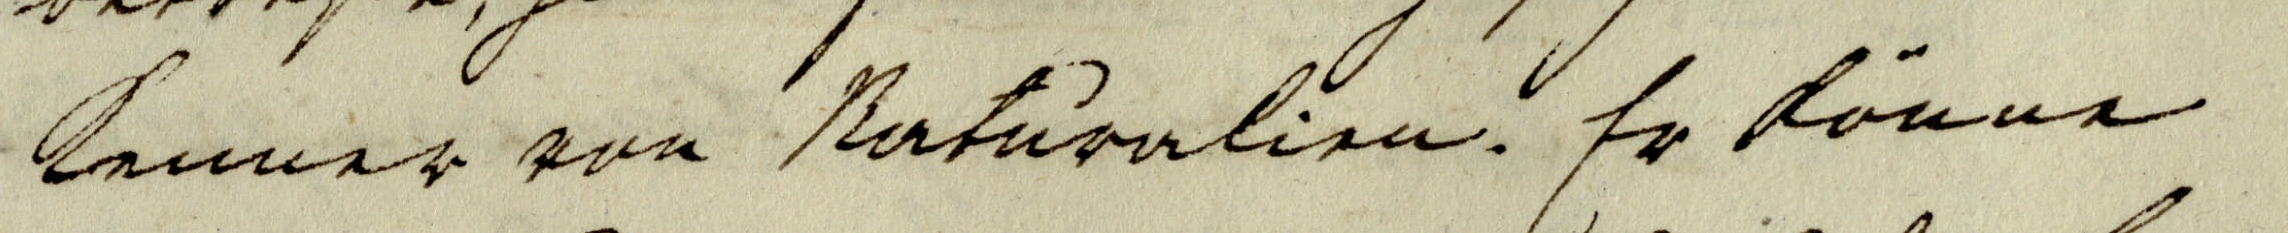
Kenner von Naturalien. Er könne
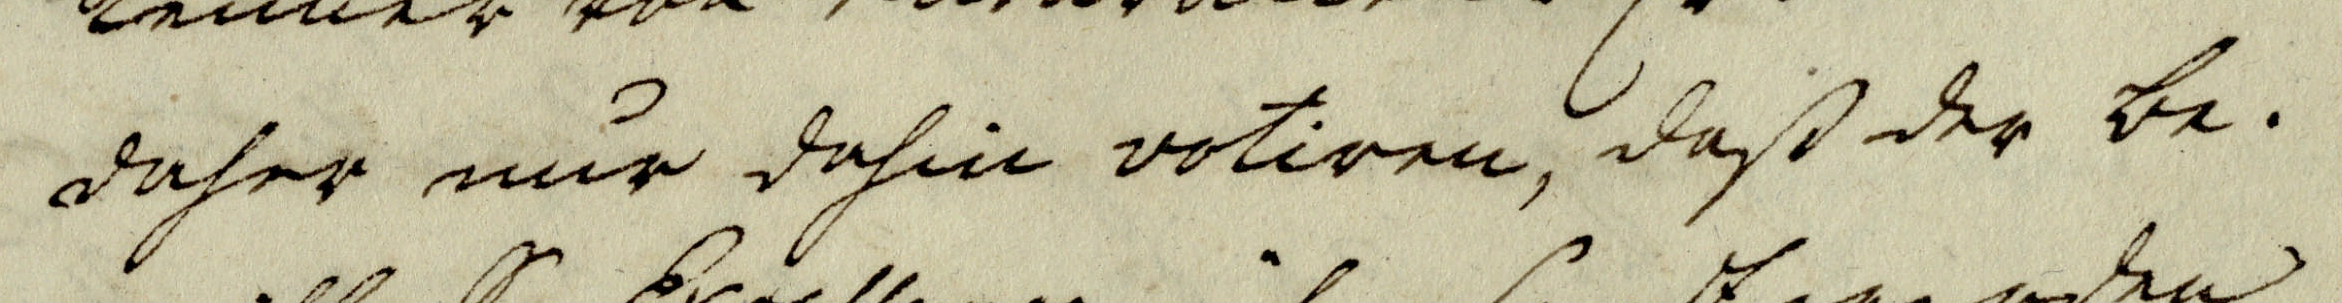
daher nur dahin votiren, daß der Be¬
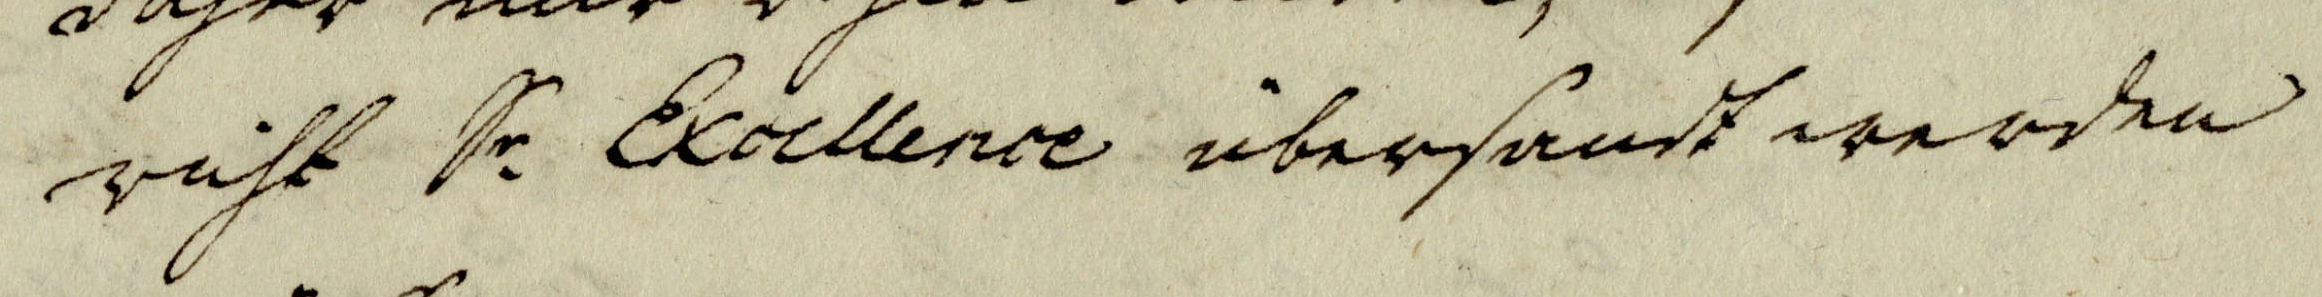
richt Sr Excellence übersandt werden
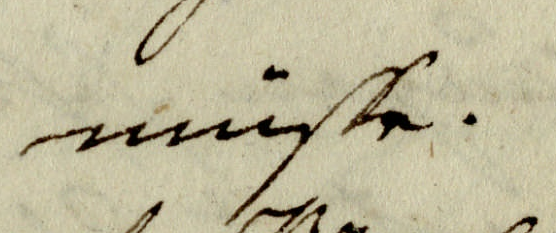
müsse.
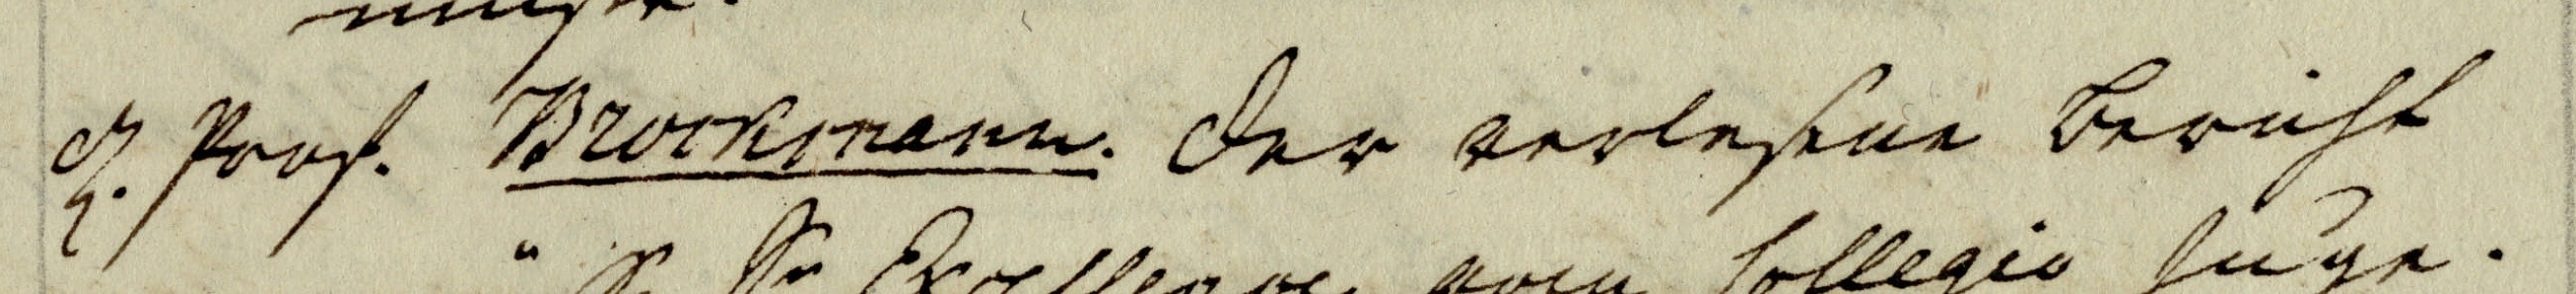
dh. Prof. Brockmann. Der verlesene Bericht
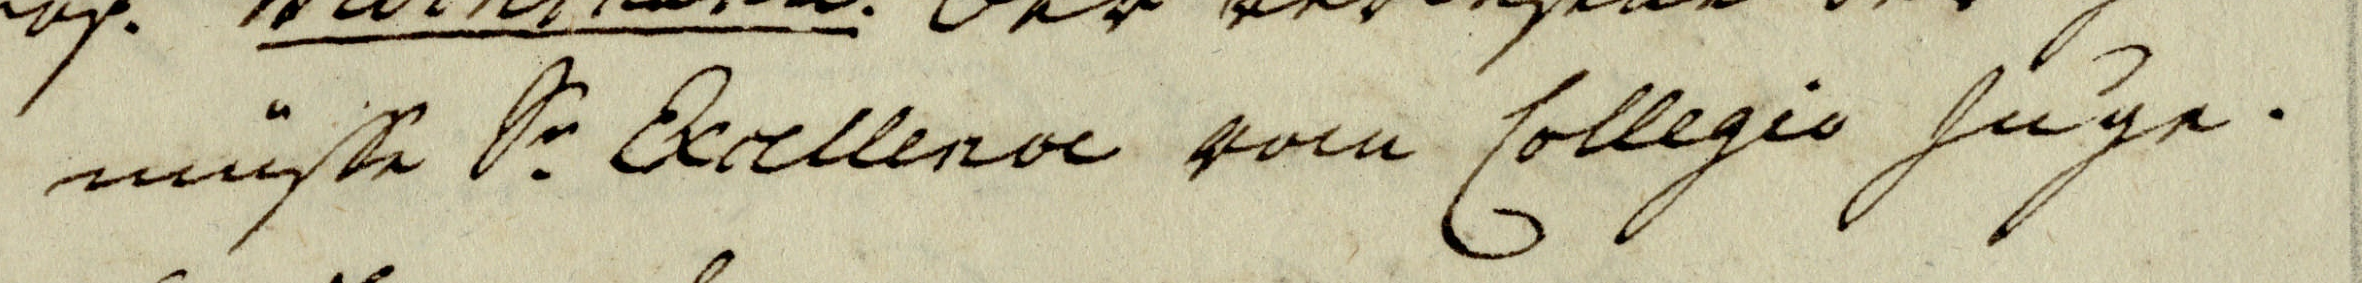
müsse Sr Excellence vom Collegio zuge¬
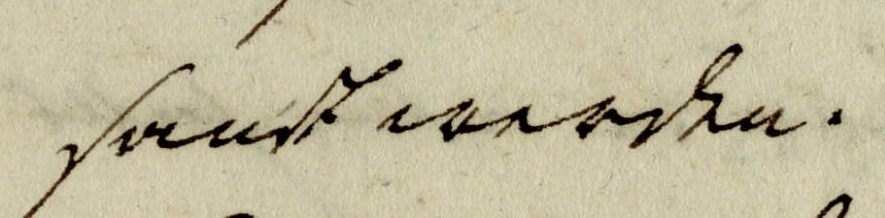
sandt werden.
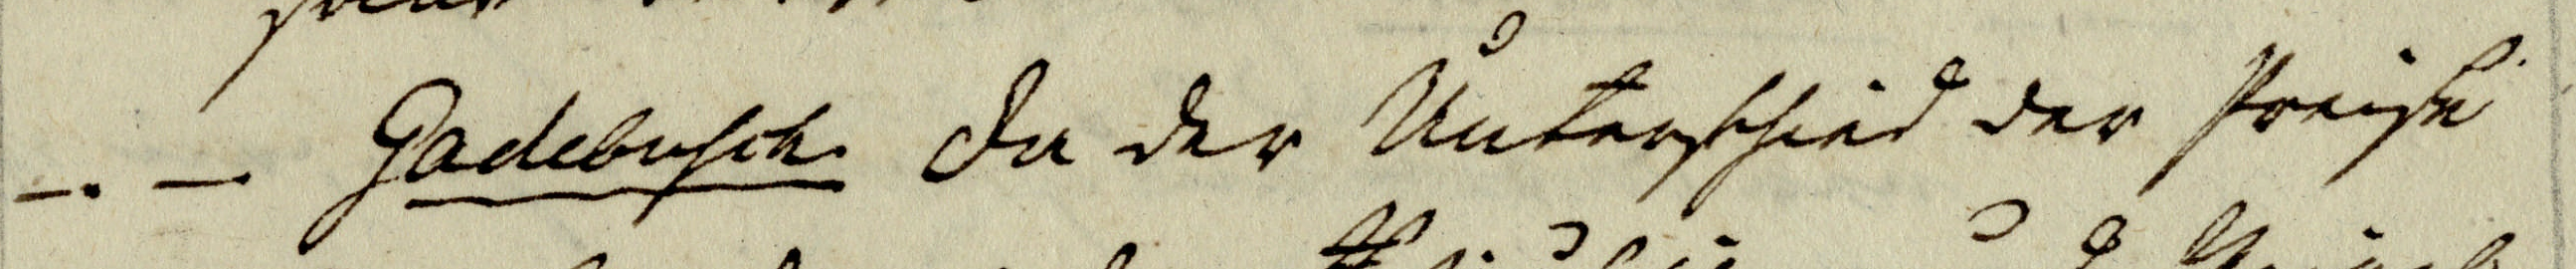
Gadebusch. Da der Unterschied der Preise
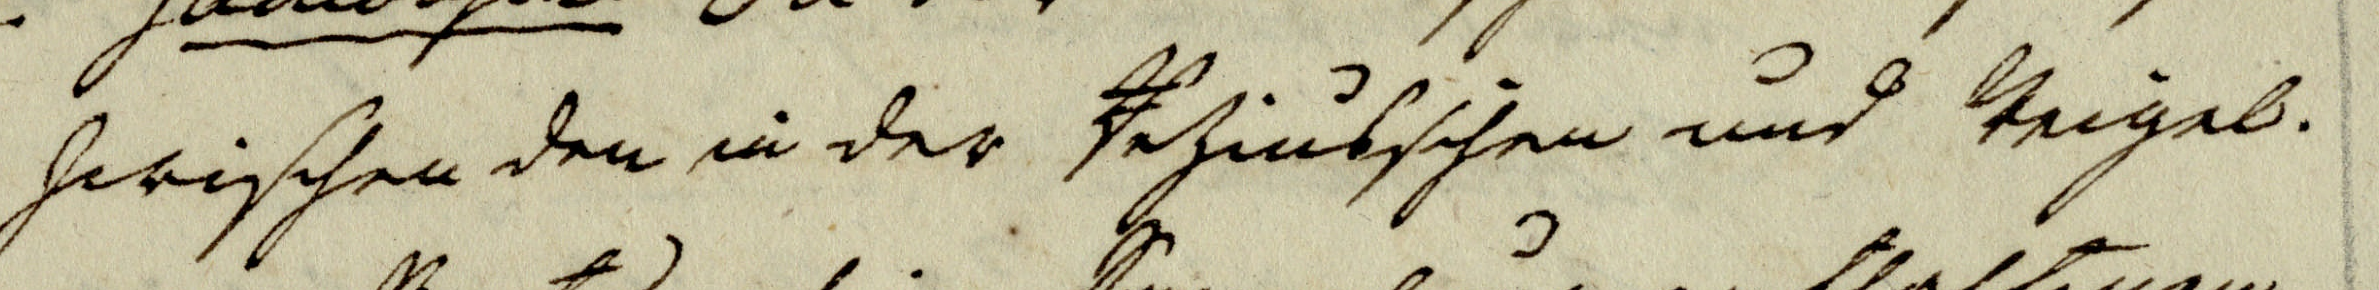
zwischen den in der Reziusschen und Weigel¬
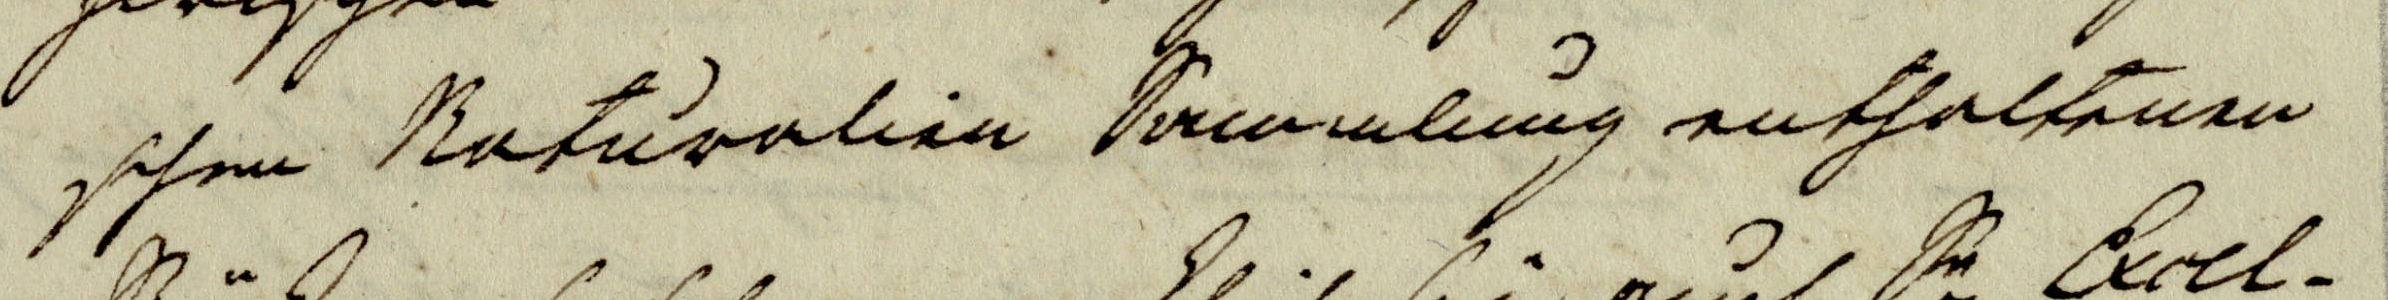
schen Naturalien Sammlung enthaltenen
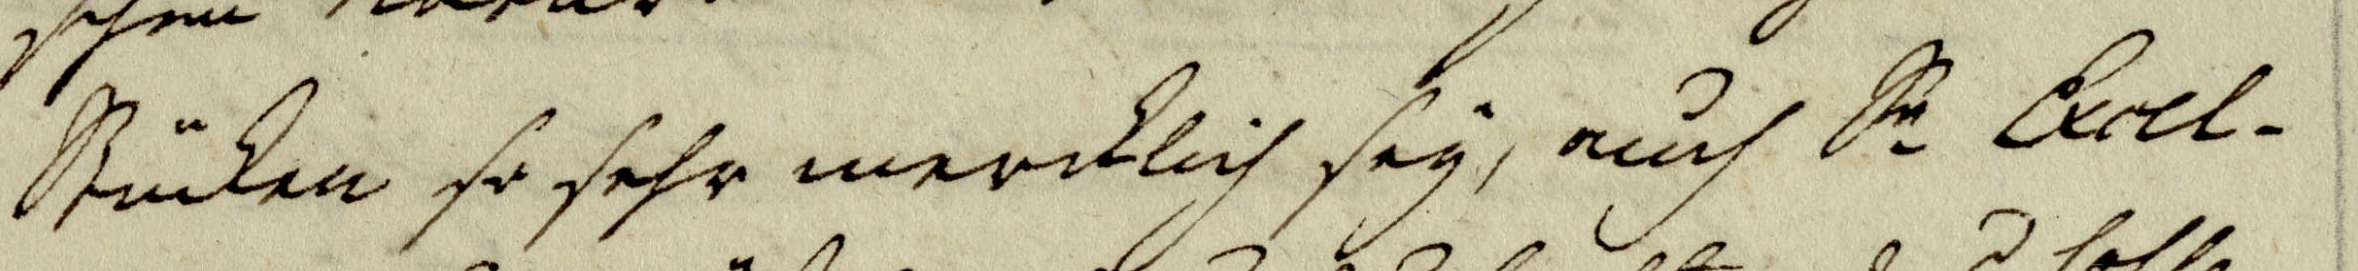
Stücken so sehr mercklich seÿ, auch Sr Excel¬
